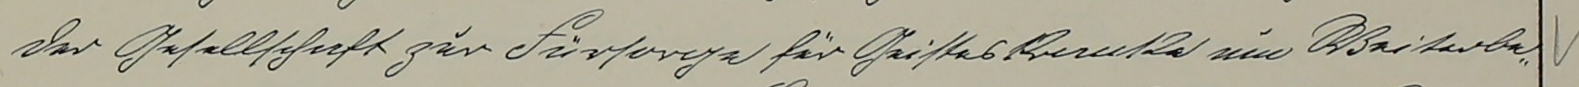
der Gesellschaft zur Fürsorge für Geisteskranke um Weiterbe-
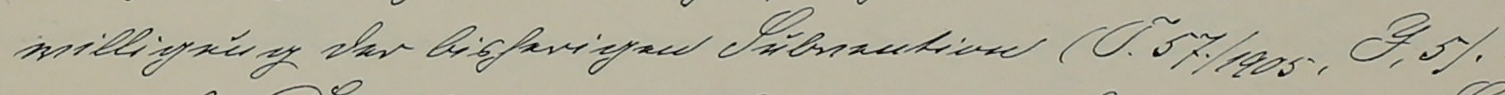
willigung der bisherigen Subvention (T.57/1905, J.5).
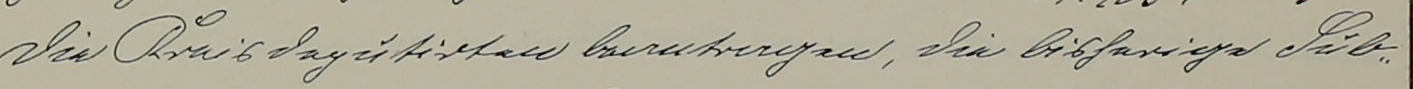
Die Kreisdeputirten beantragen, die bisherige Sub-
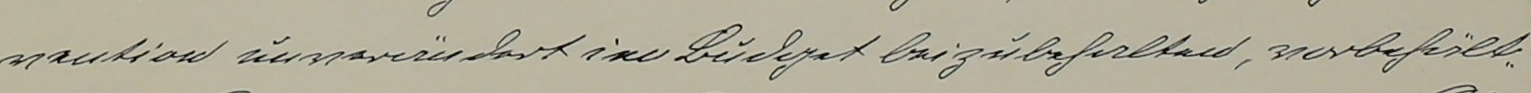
vention unverändert im Budget beizubehalten, vorbehält-
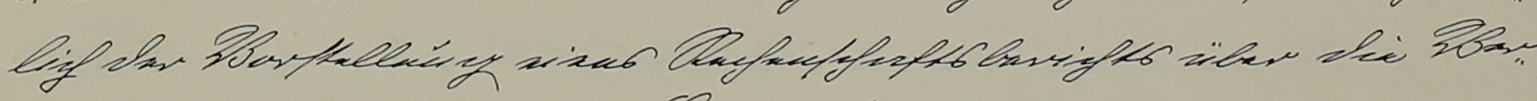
lich der Vorstellung eines Rechenschaftsberichts über die Ver-
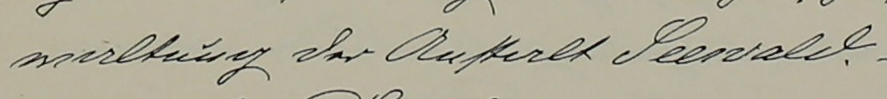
waltung der Anstalt Seewald.
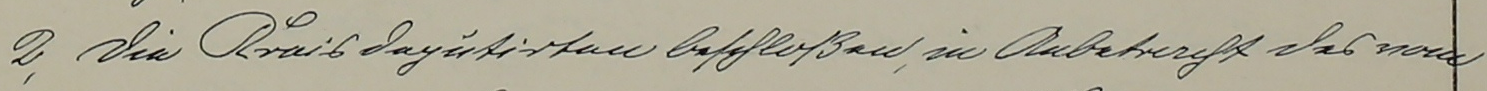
2. Die Kreisdeputirten beschloßen, in Anbetracht des vom
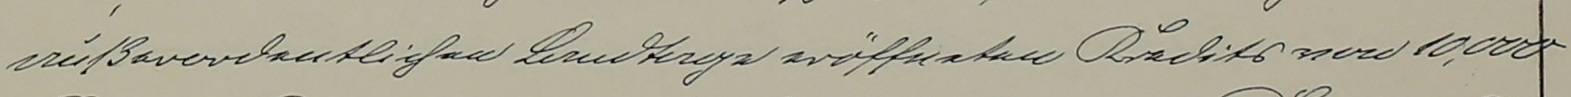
außerordentlichen Landtage eröffneten Kredits von 10.000
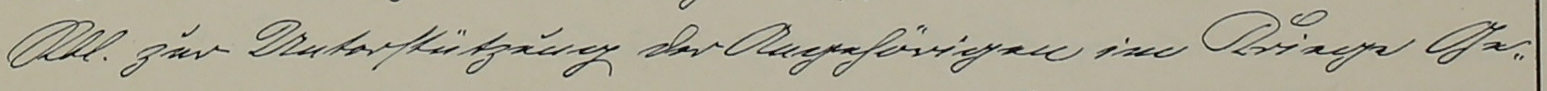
Rbl. zur Unterstützung der Angehörigen im Kriege Ge-
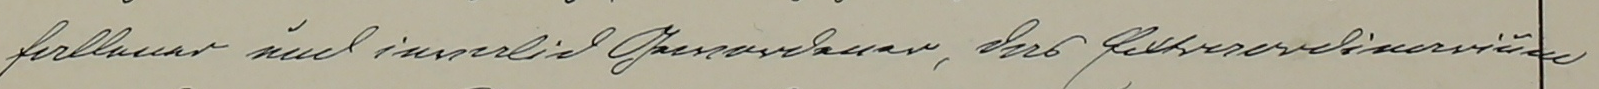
fallener und invalid Gewordener, das Extraordinarium
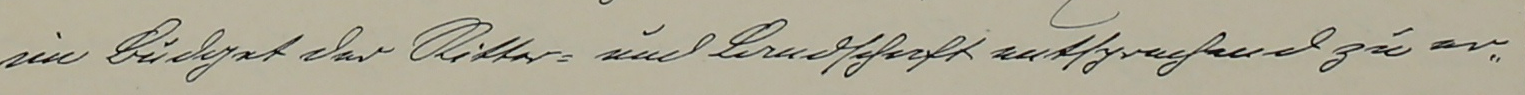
im Budget der Ritter- und Landschaft entsprechend zu er-
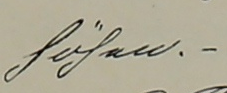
höhen.
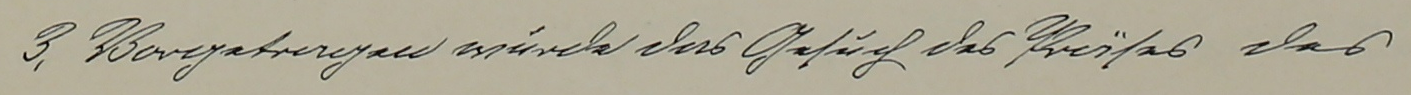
3. Vorgetragen wurde das Gesuch des Präses des
